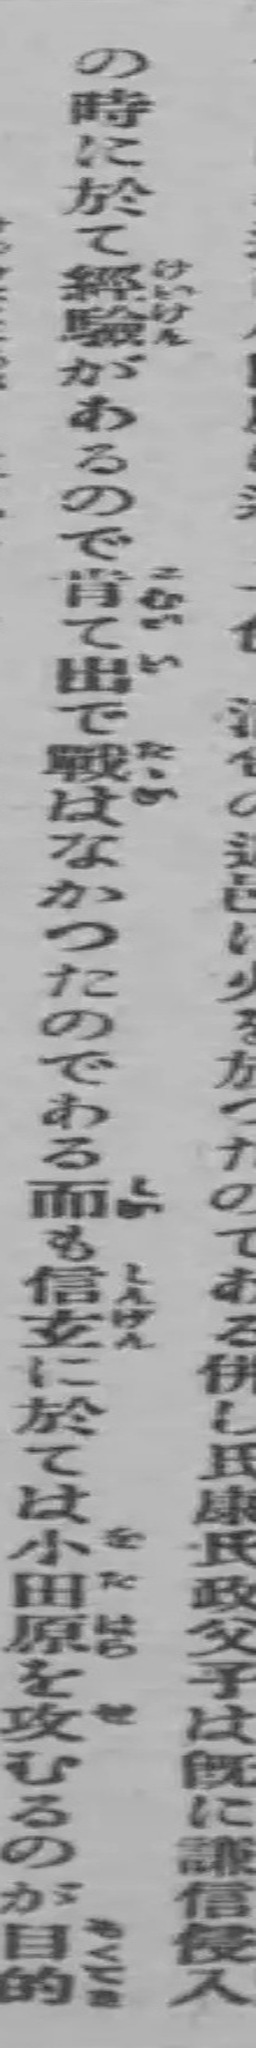の時に於て経験があるので背て出で戦はなかつたのである而も信玄に於ては小田原を攻むるのが目的
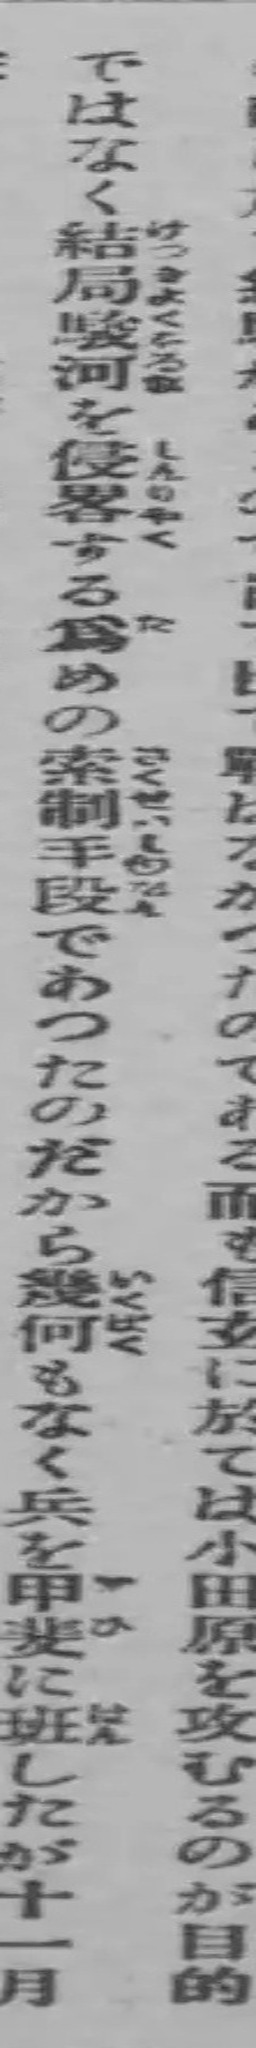ではなく結局駿河を侵略する為めの索制手段であつたのだから幾何もなく兵を甲斐に班したが十一月
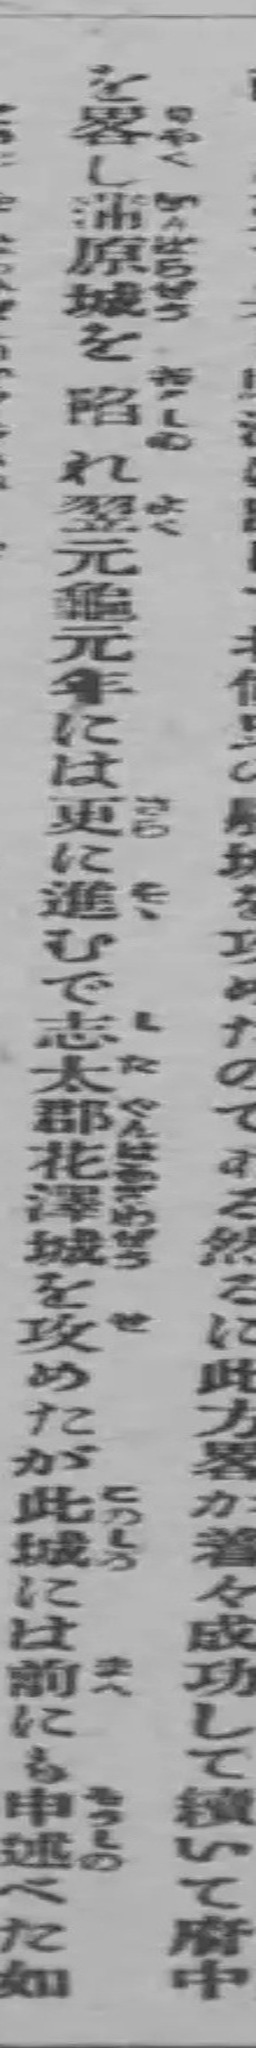を略し蒲原城を陥れ翌元亀元年には更に進むで志太郡花沢城を攻めたが此城には前にも申述べた如
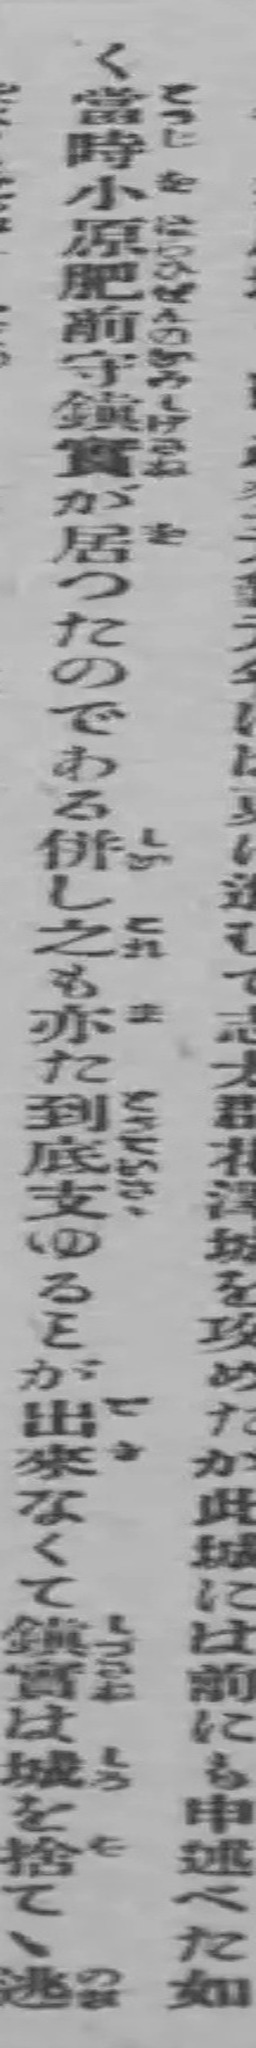く当時小原肥前守鎮実が居つたのである併し之も亦た到底支ゆることが出来なくて鎮実は城を捨てゝ逃
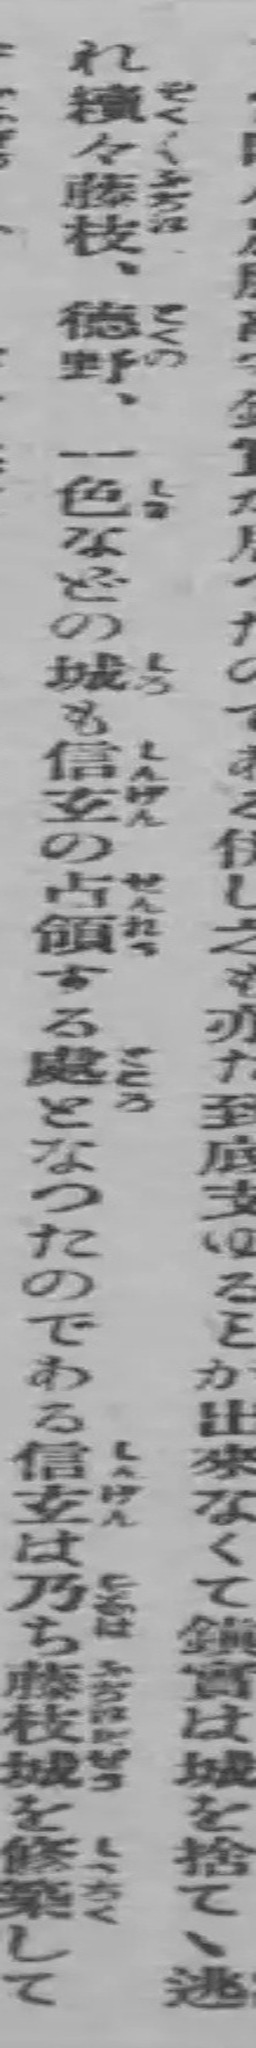れ続々藤枝、徳野、一色などの城も信玄の占領する処となつたのである信玄は乃ち藤枝城を修築して
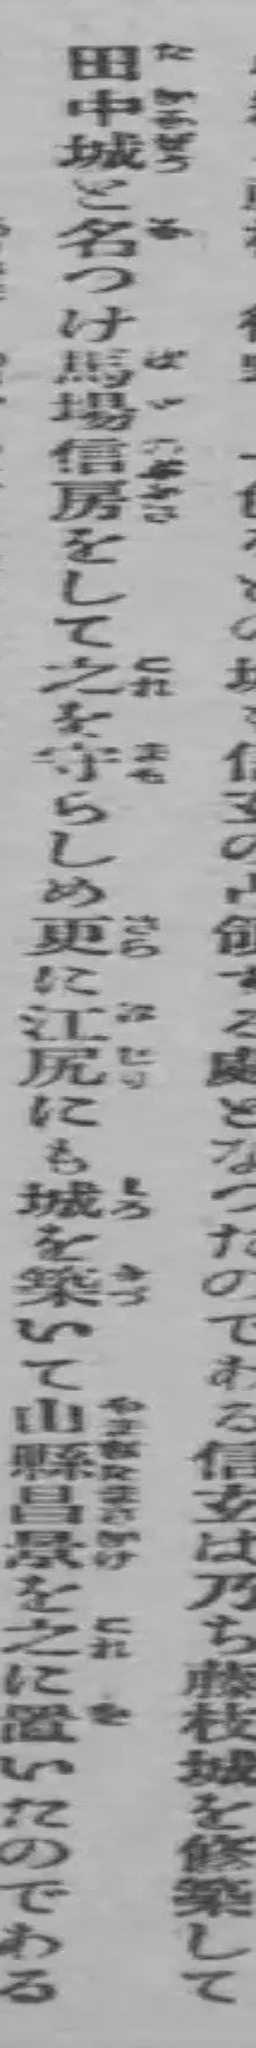田中城と名つけ馬場信房をして之を守らしめ更に江尻にも城を築いて山縣昌景を之に置いたのである
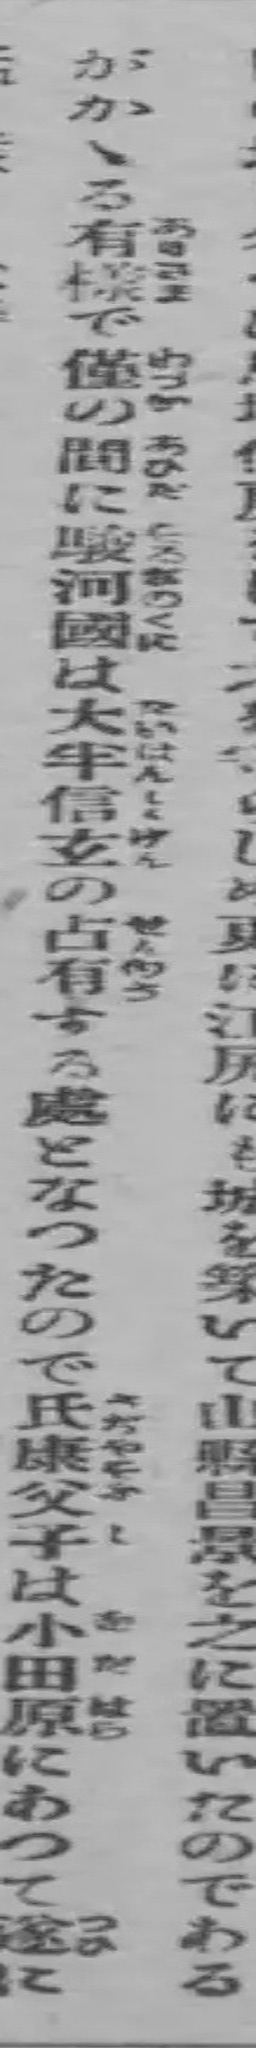がかゝる有様で僅の間に駿河国は大半信玄の占有する処となつたので氏康父子は小田原にあつて遂に
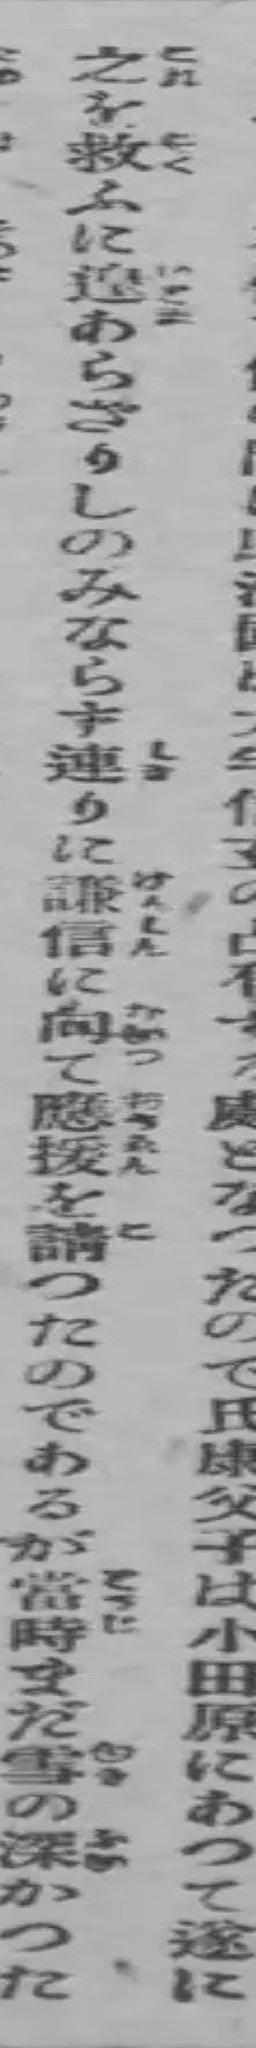之を救ふに遑あらざりしのみならず連りに謙信に向て応援を請つたのであるが当時まだ雪の深かつた
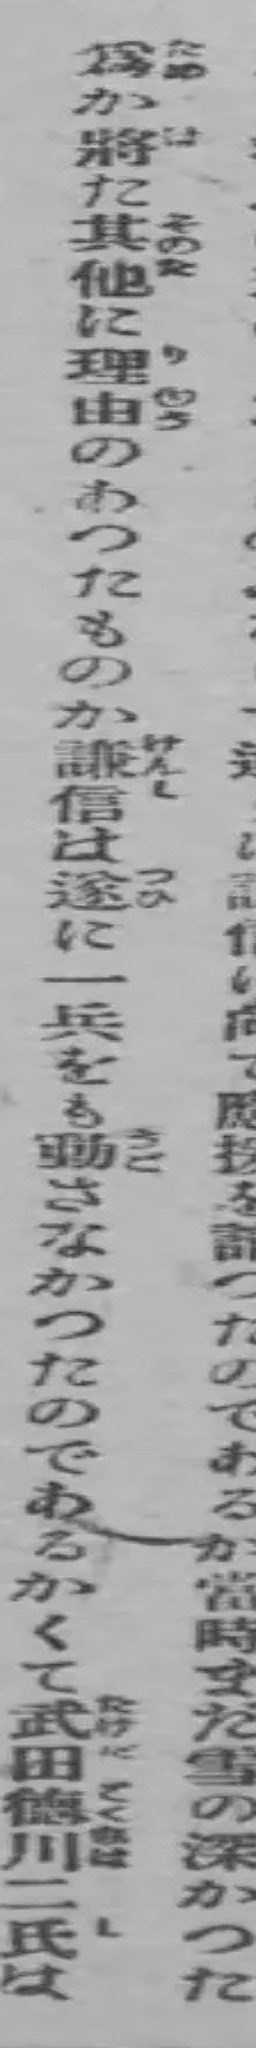為か将た其他に理由のあつたものか謙信は遂に一兵をも動さなかつたのであるかくて武田徳川二氏は
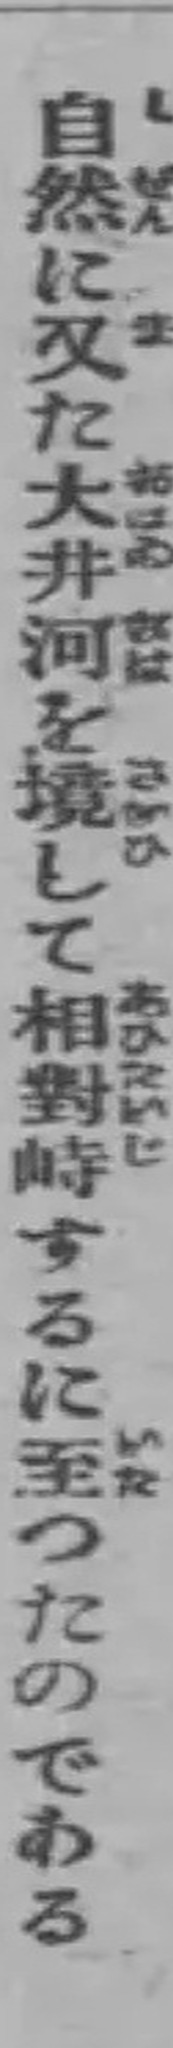自然に又た大井河を境して相対峙するに至つたのである
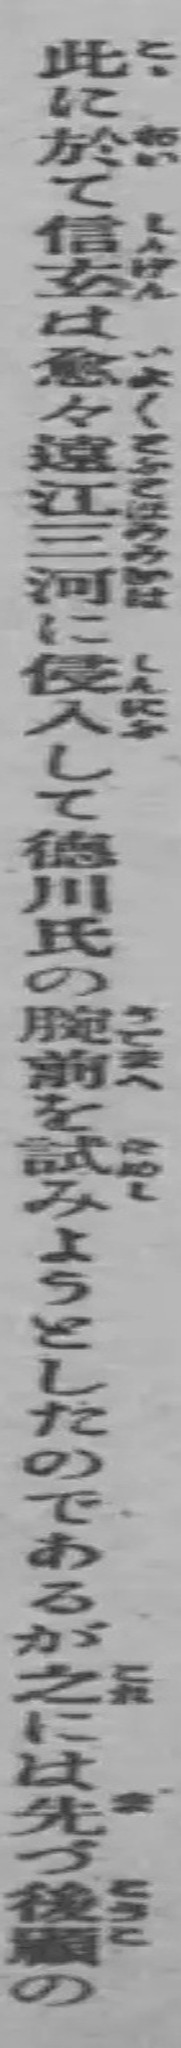此に於て信玄は愈々遠江三河に侵入して徳川氏の腕前を試みようとしたのであるが之には先づ後顧の
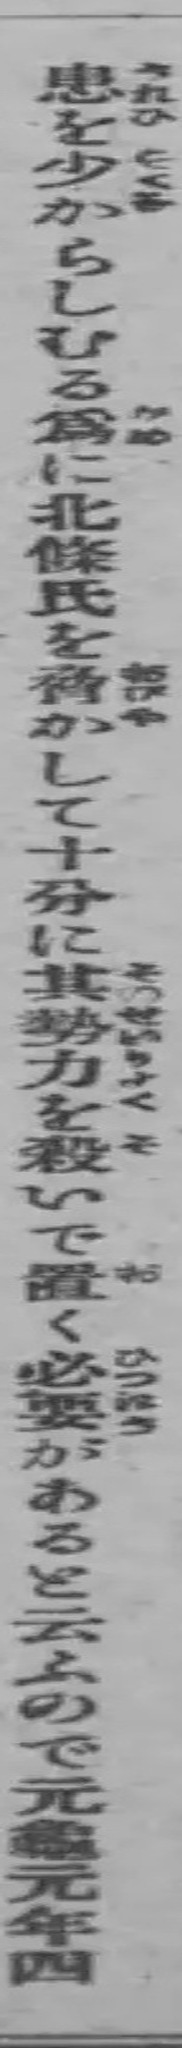患を少からしむる為に北条氏を脅かして十分に其勢力を殺いで置く必要があると云ふので元亀元年四
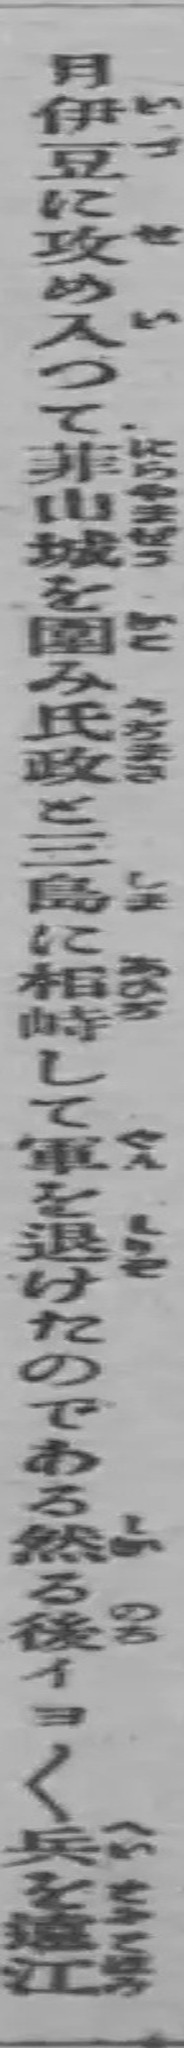月伊豆に攻め入つて韮山城を囲み氏政と三島に相峙して軍を退けたのである然る後イヨ〳〵兵を遠江
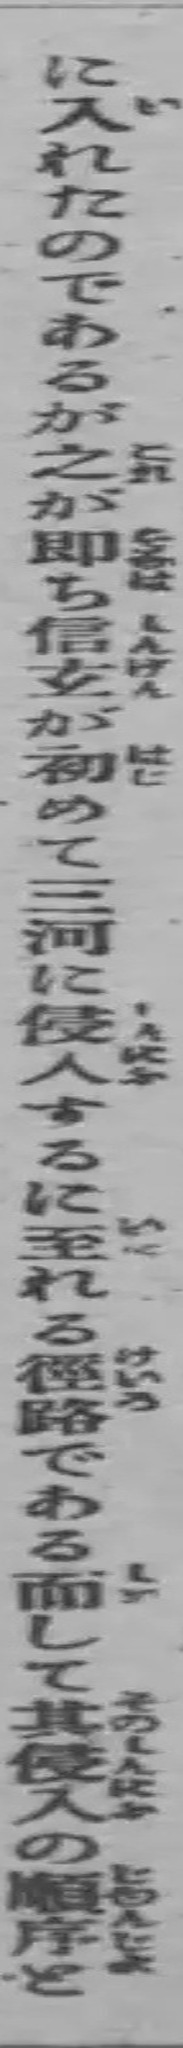に入れたのであるが之が即ち信玄が初めて三河に侵入するに至れる経路である而して其侵入の順序と
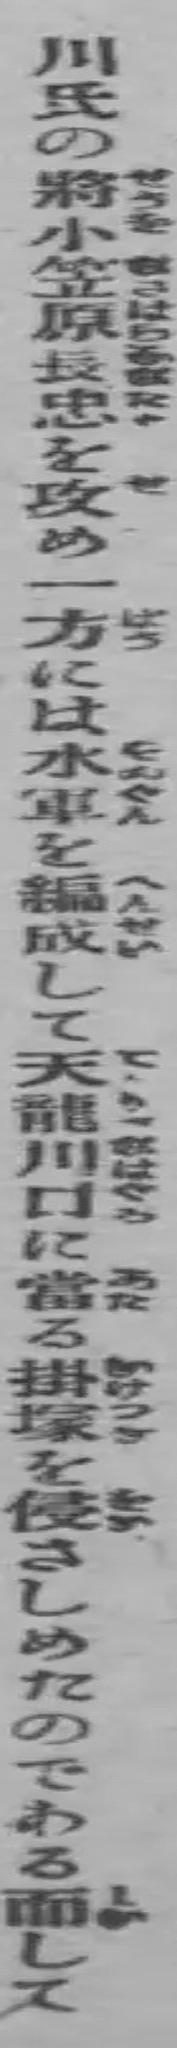川氏の将小笠原長忠を攻め一方には水軍を編成して天龍川口に当る掛塚を侵さしめたのである而して
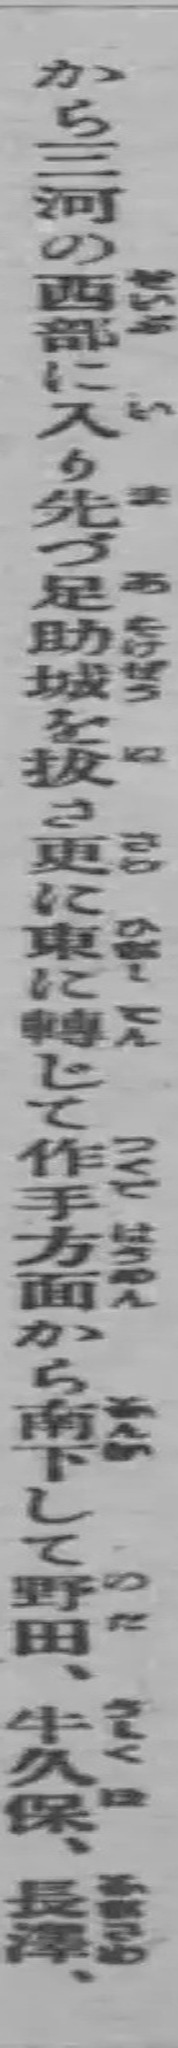すから三河の西部に入り先づ足助城を抜き更に東に転じて作手方面から南下して野田、牛久保、長沢、
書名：豊橋市史談
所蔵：国立国会図書館 National Diet Library, JAPAN
